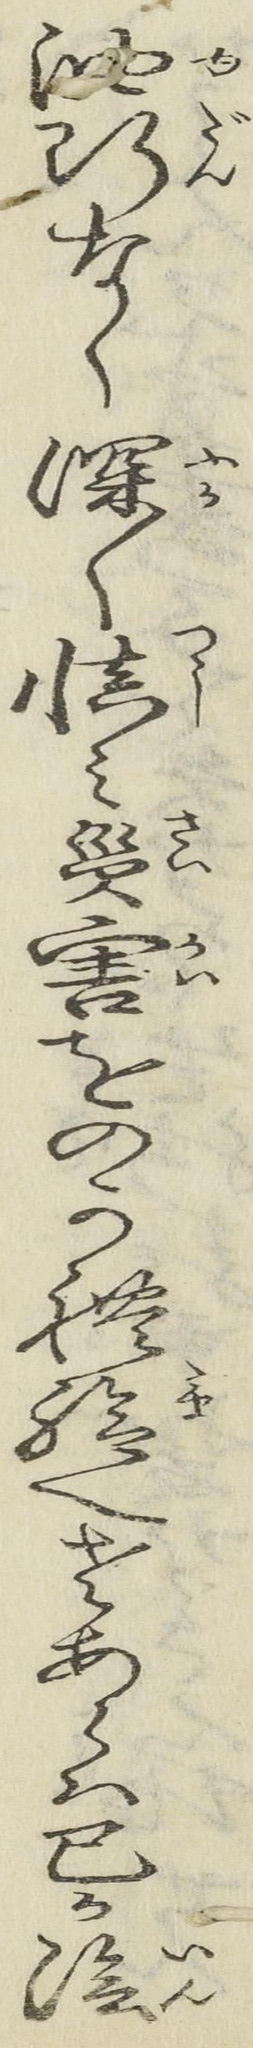油断なく深く慎み災害をのかれ給へさあらは己か陰
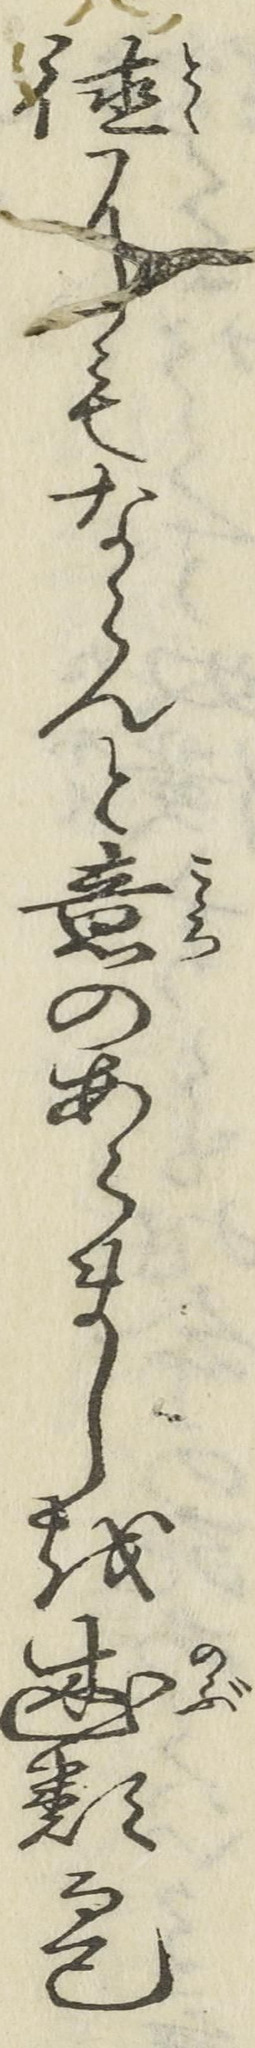徳にもならんと意のあらましを述るるのみ
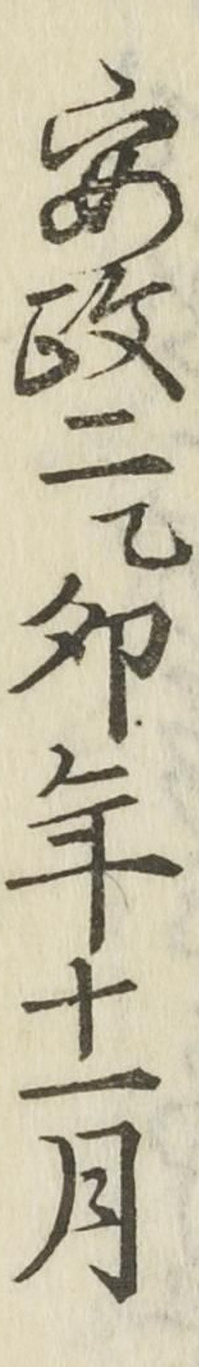安政二乙卯年十一月
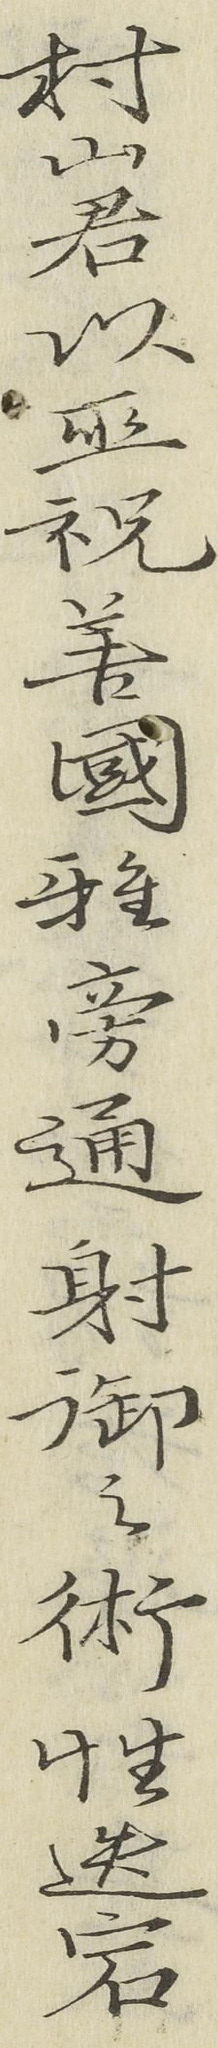村山君以巫祝善國雅旁通射御之術性迭宕
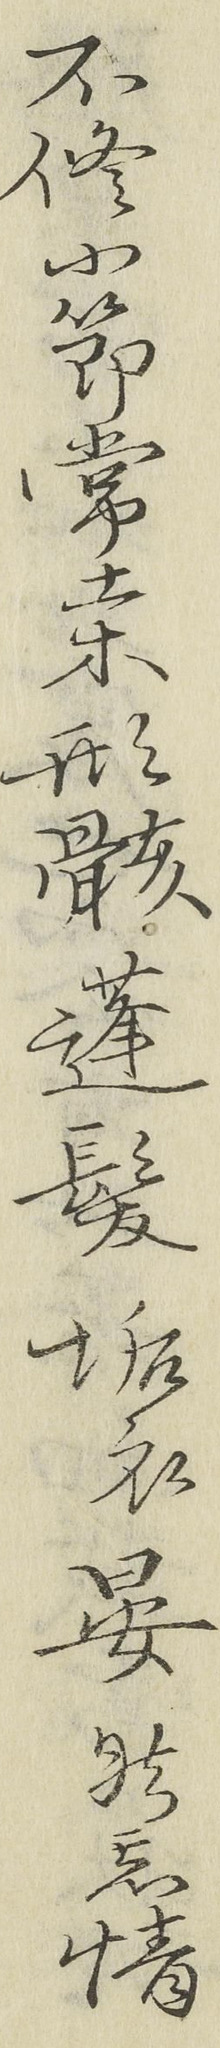不修小節常土木形骸蓬髪垢衣晏然忘情
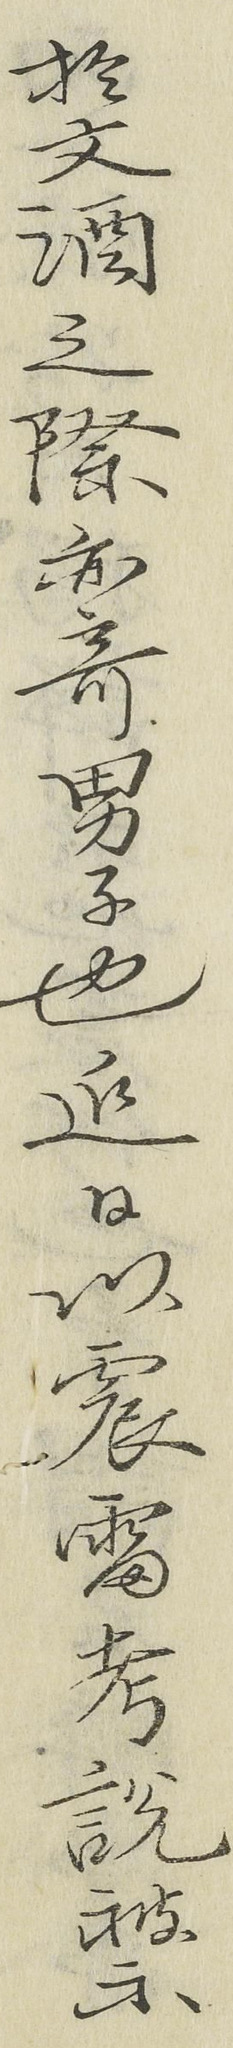拾文酒之際亦奇男子也追日以震雷考説被示
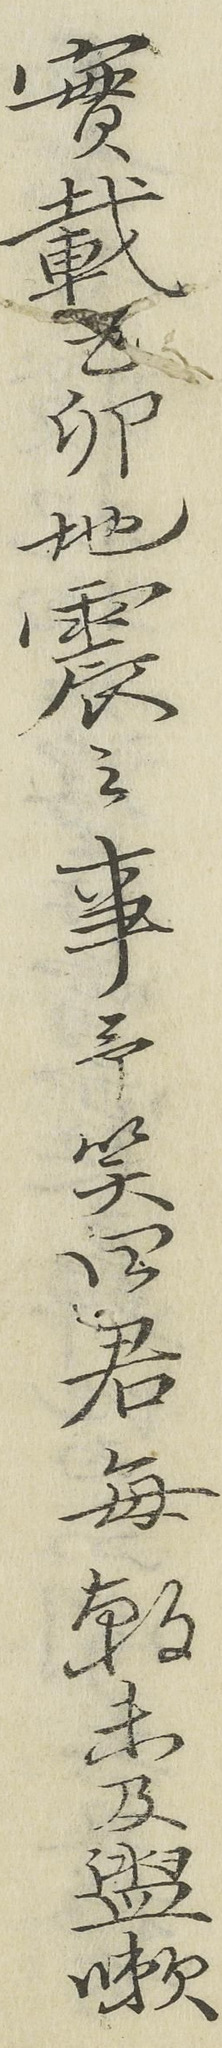実載乙卯地震之事予笑四君朝未及盥嗽
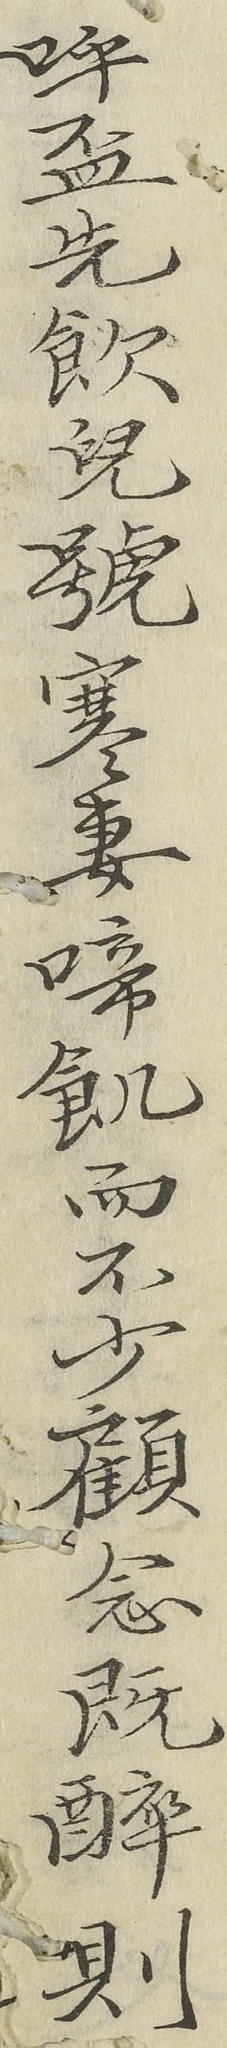呼盃先飲児号寒妻啼飢而不少顧念既酔則

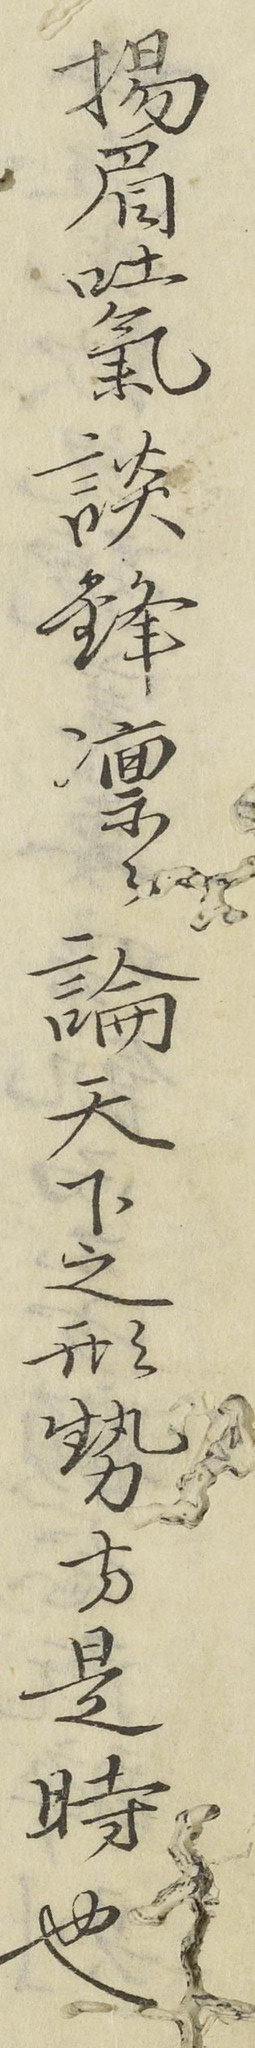揚眉吐気談鋒凛々論天下之形勢方是時也
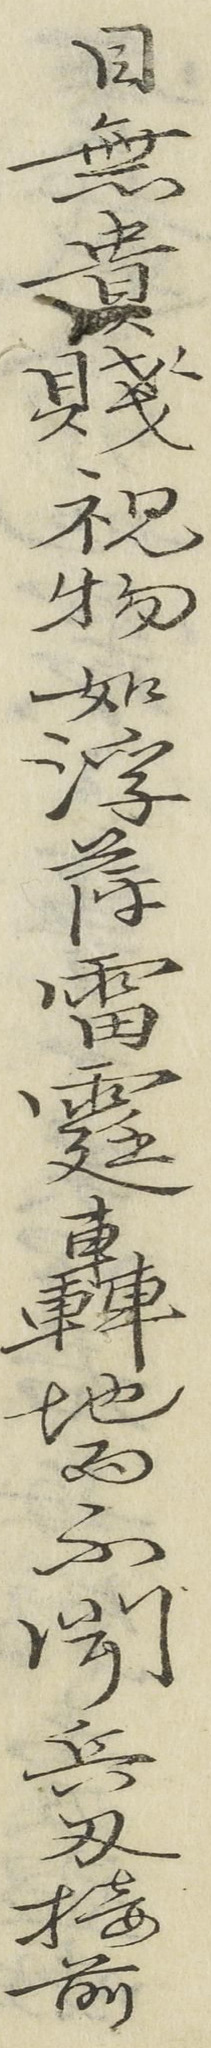目無貴賤祝物如浮薄雷霆轟地内而不聞兵刃接前
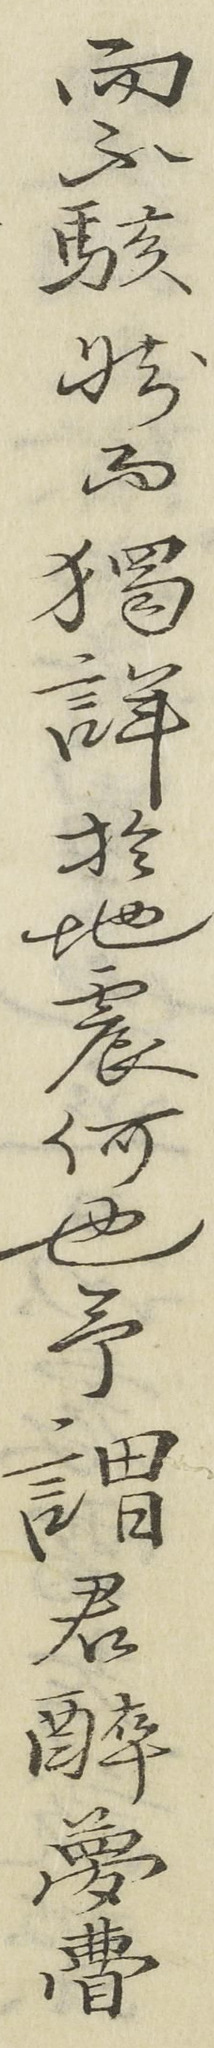而不駭時而獨詳於地震何也予謂君酔夢
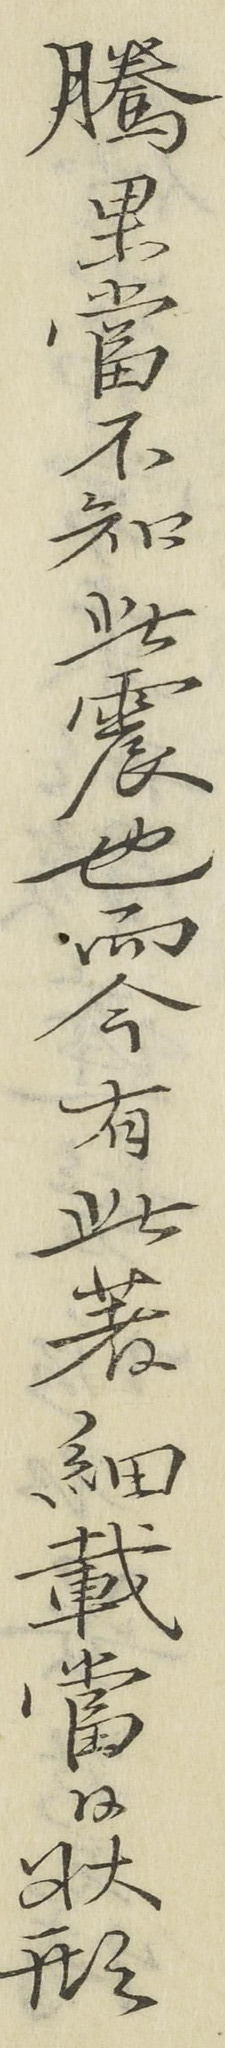騰里当不知此震也而今有此著細載当日状形
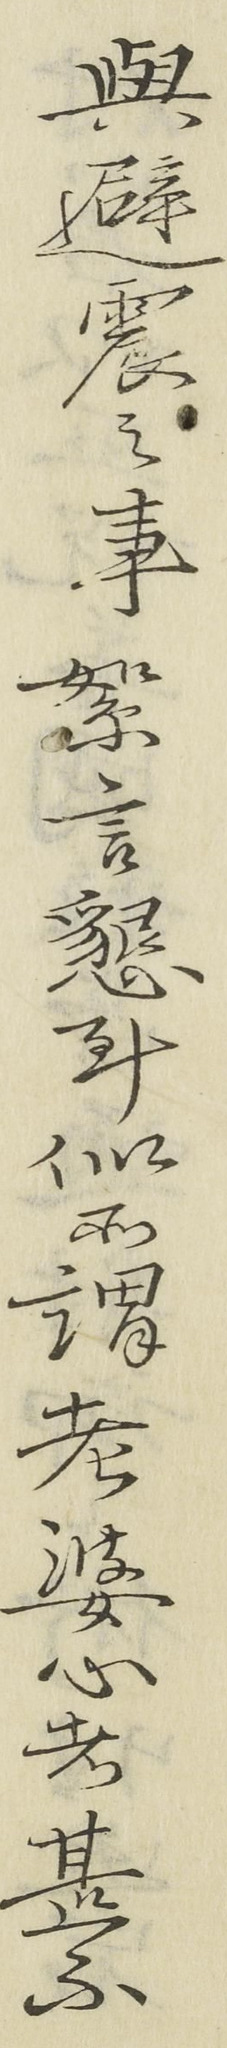与避震之事絮言懇斗似所謂老婆心考甚不
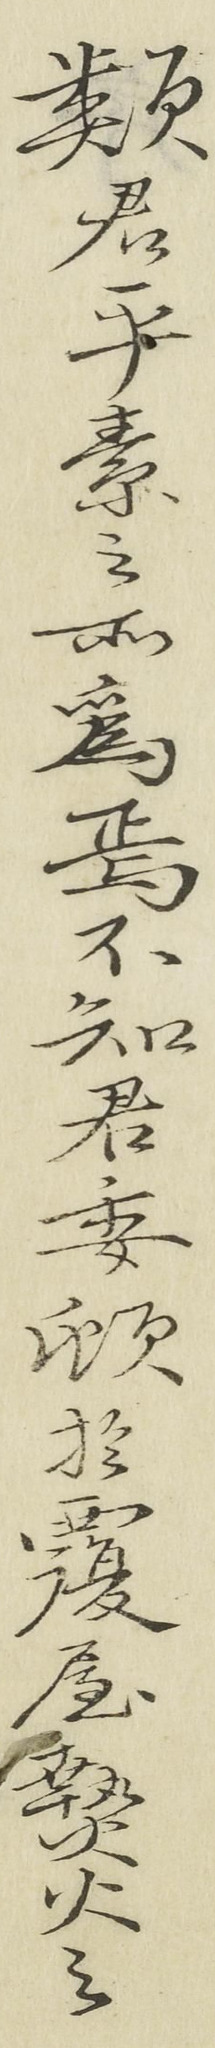類君乎素之所為焉不知君委頓於覆屋熱火之
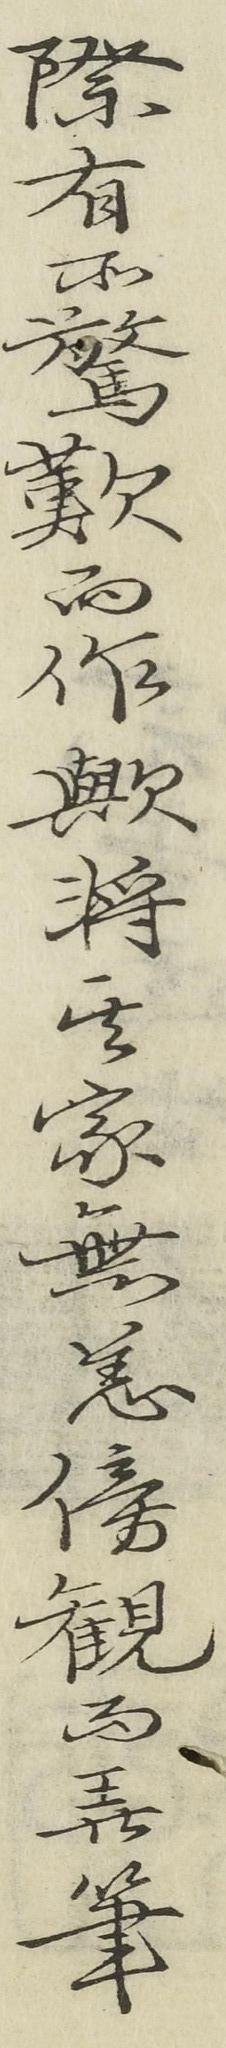際有所驚嘆而作歟将其家無恙傍観而弄筆
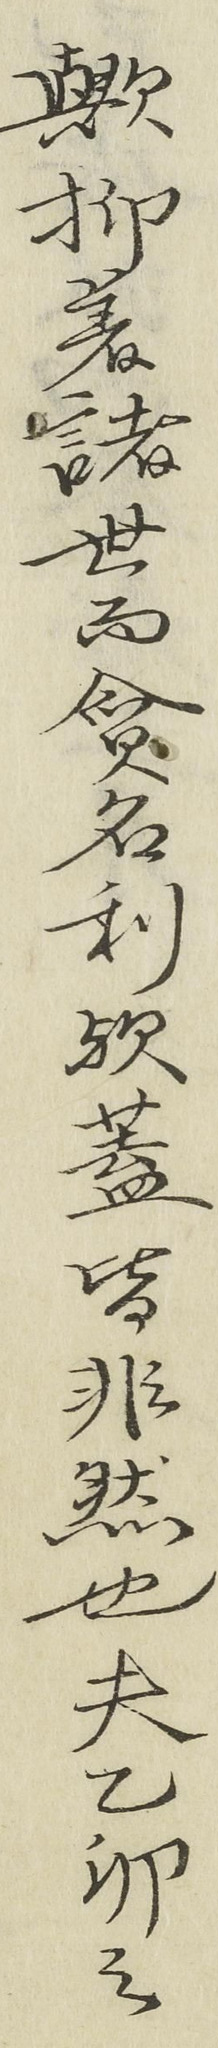歟抑着諸世而貪名利歟蓋皆非然也夫乙卯之
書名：震雷考説　全
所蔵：東京大学地震研究所図書室 Earthquake Research Institute Library, The University of Tokyo, JAPAN
